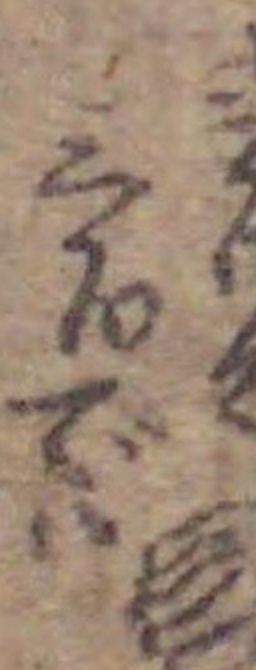三百では

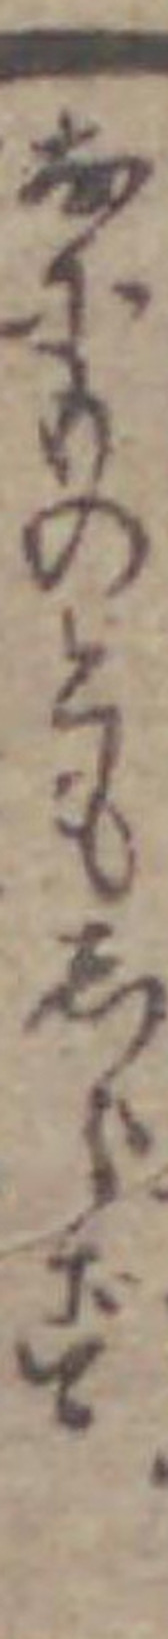なにものともしらず
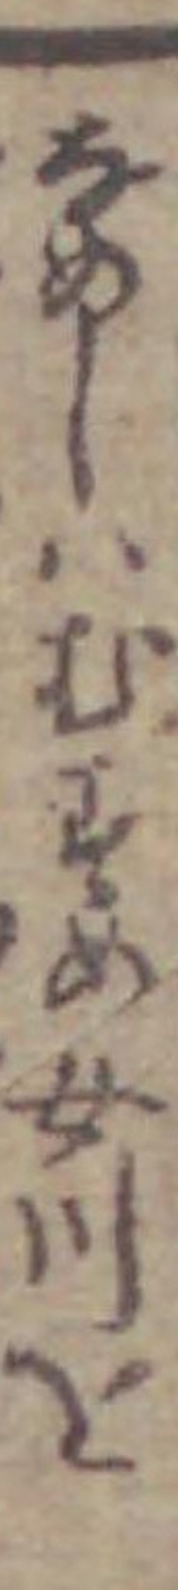なめしはむすめ女川を
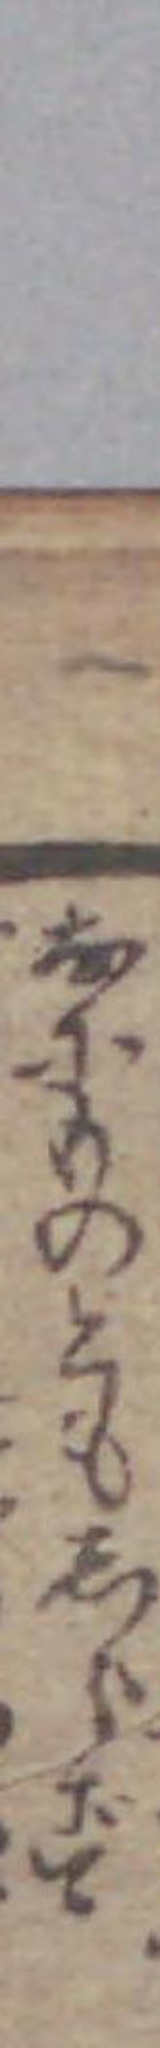なにものともしらず
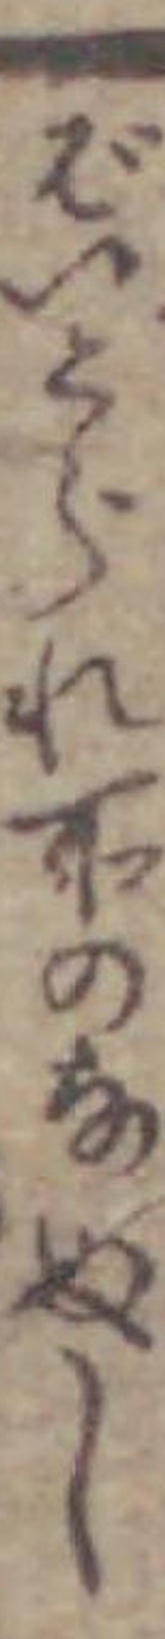ばいとられ所のなぬし
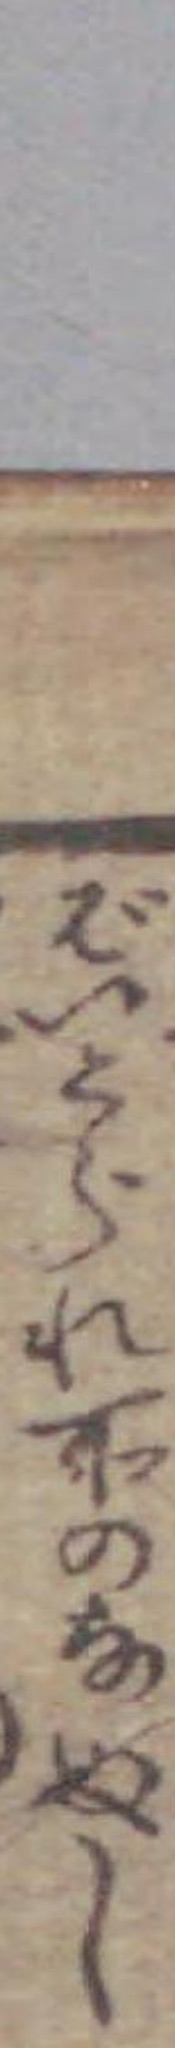ばいとられ所のなぬし
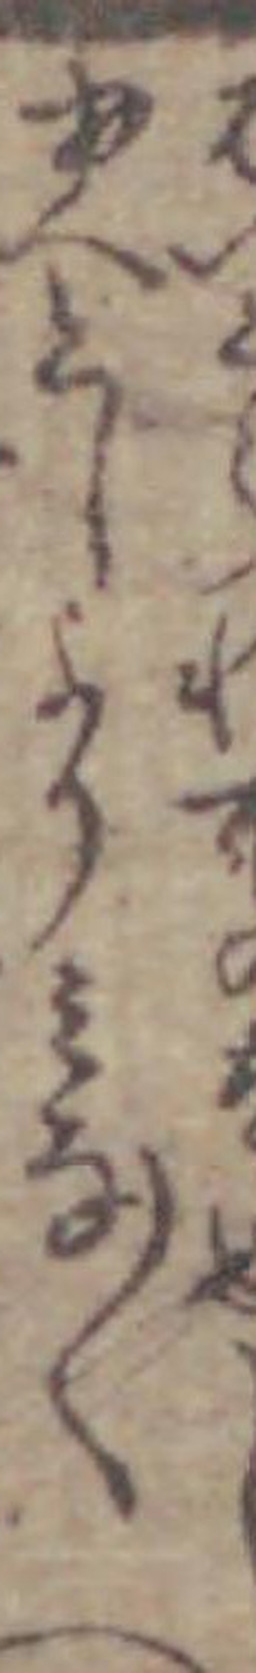ゆへとしよりみな〳〵
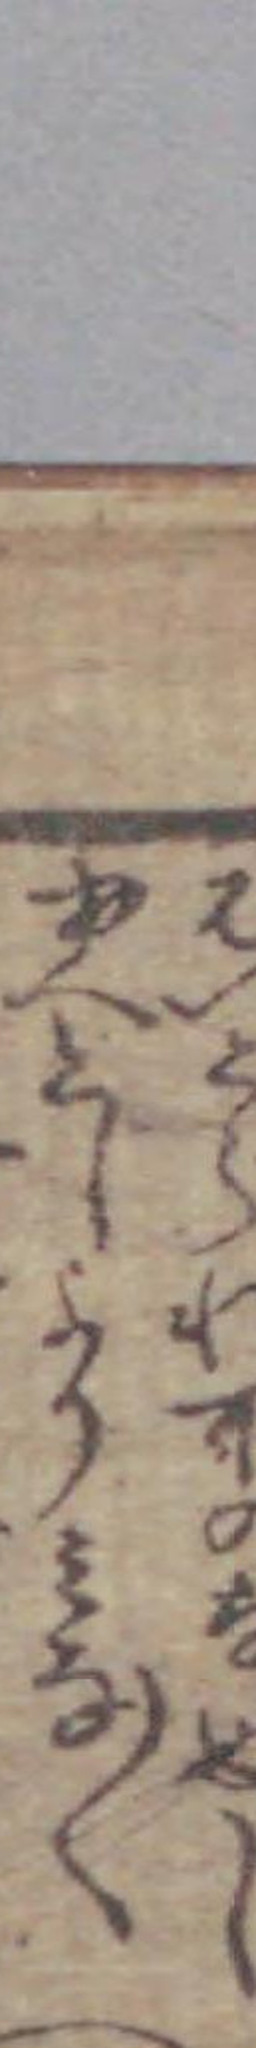ゆへとしよりみな〳〵
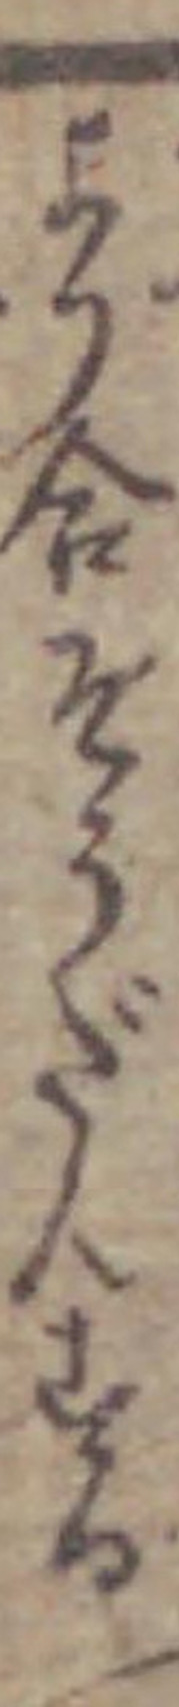より合そうだんする
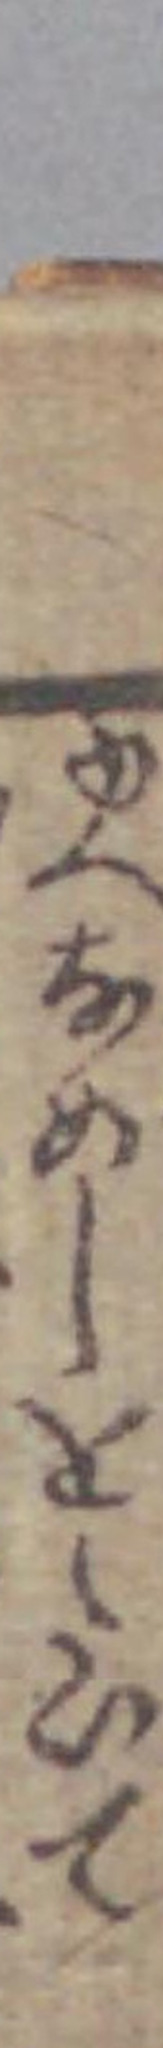ゆへなめしをたいて
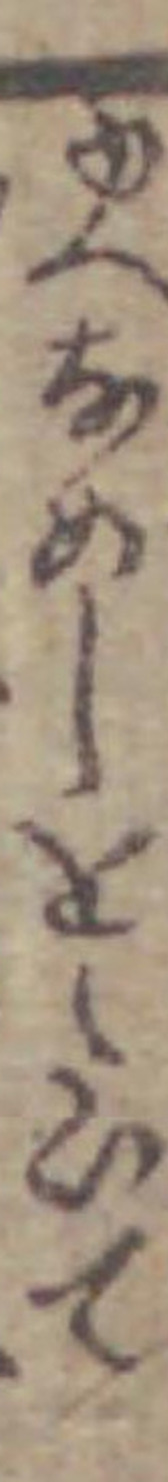ゆへなめしをたいて
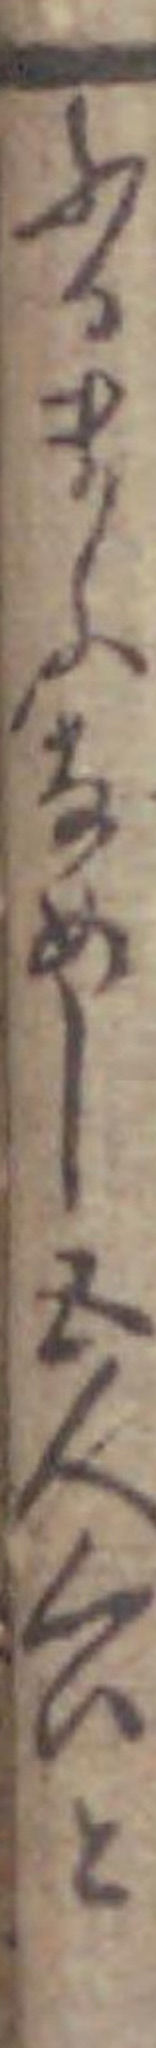ふるまふなめし五人ぐいと
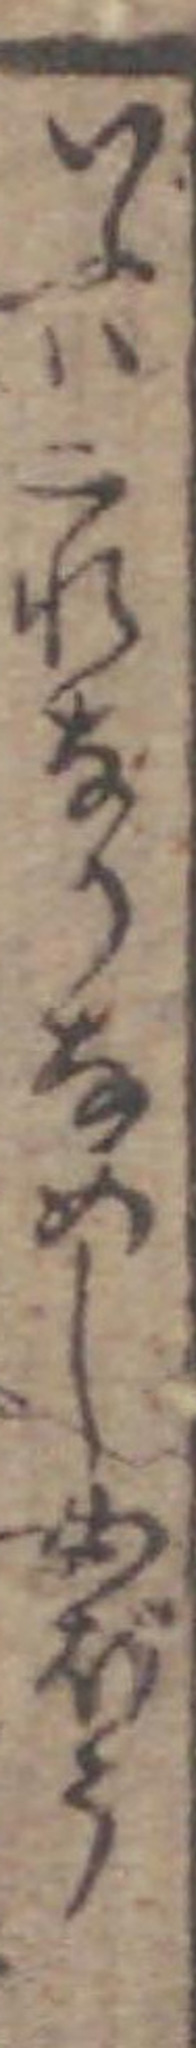いふはこれなりなめし女ぼう
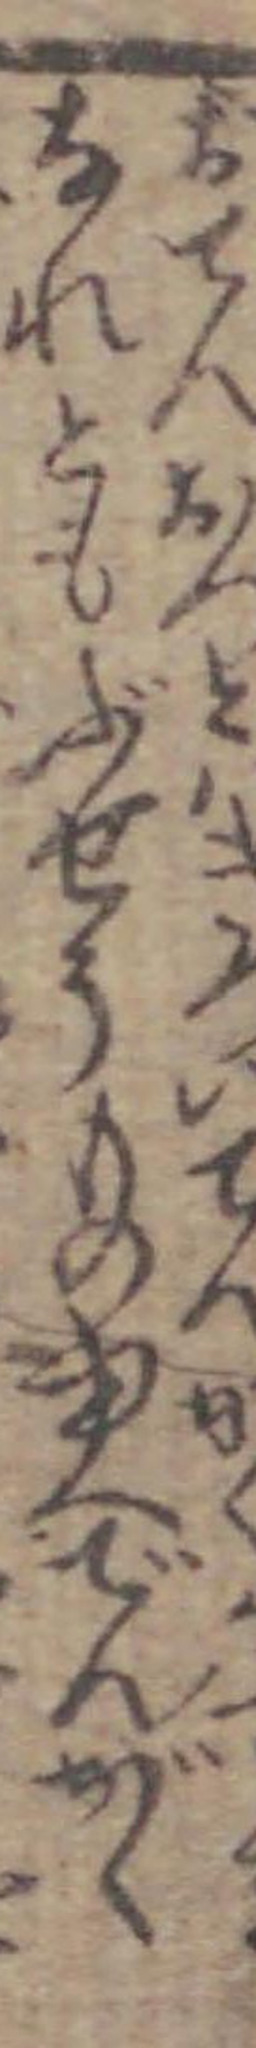なれどもぶせうものゆへでんがく
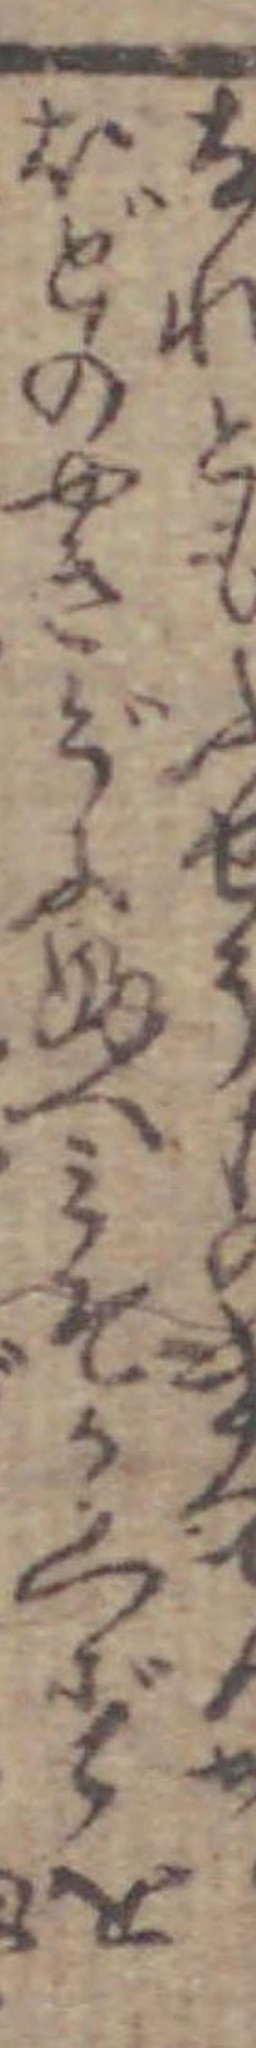ほどのやきどうふへみそかくずを
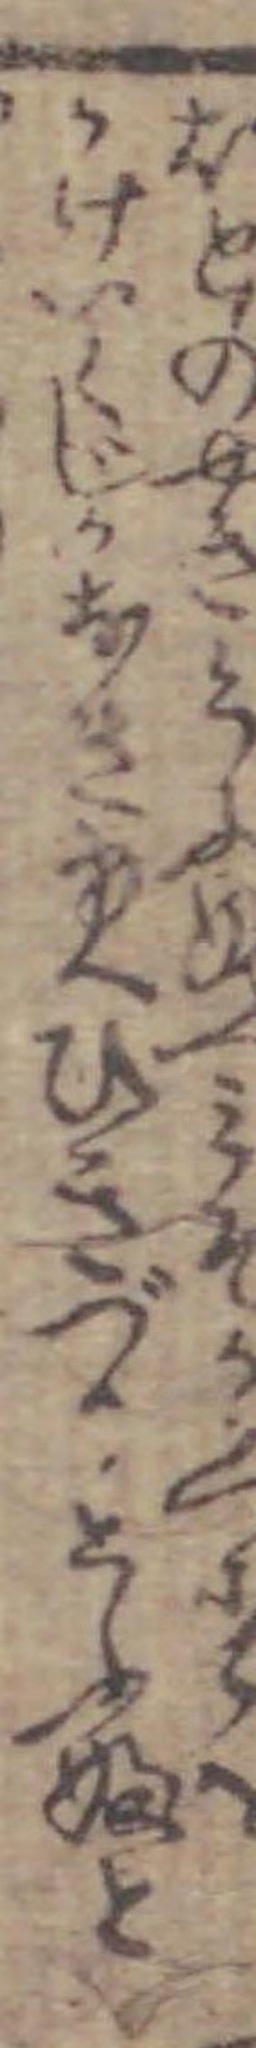かけいくじかなきゆへひきづとふふと
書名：諸事米の飯 : 3巻
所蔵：国立国会図書館 National Diet Library, JAPAN
